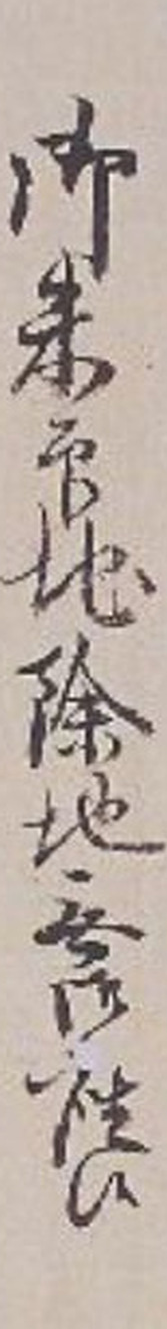御朱印地除地無御座候
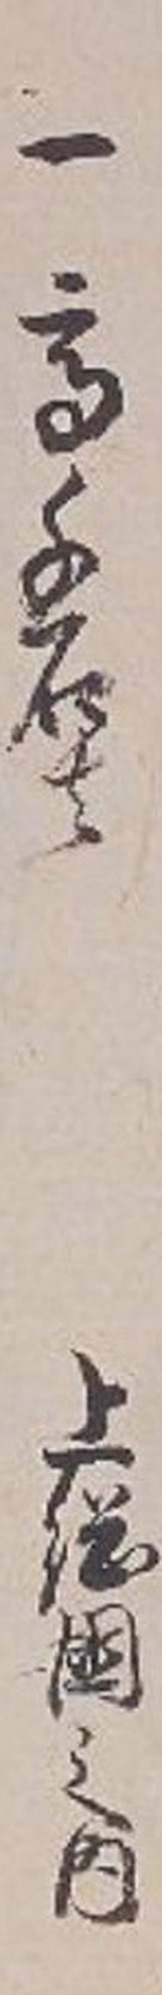一高千石者上総国之内
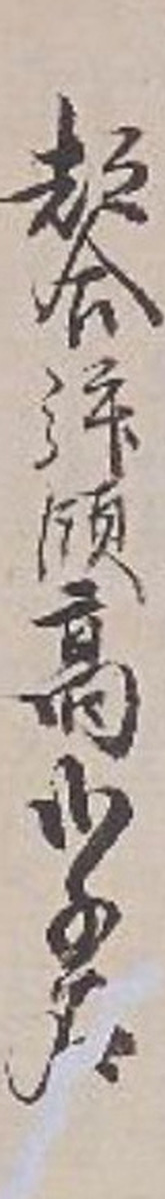都合拝領高弐千石
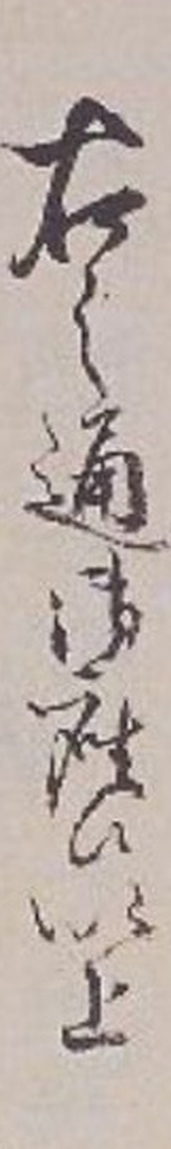右之通御座候以上
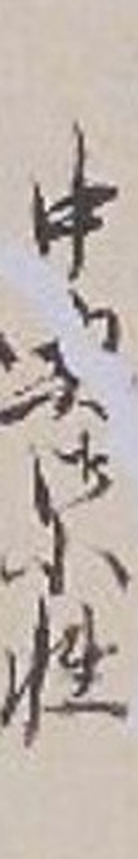中奥御小性
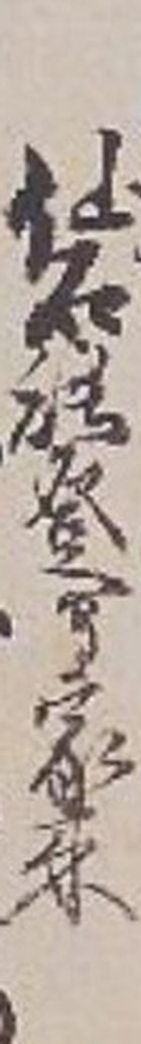仙石能登守家来

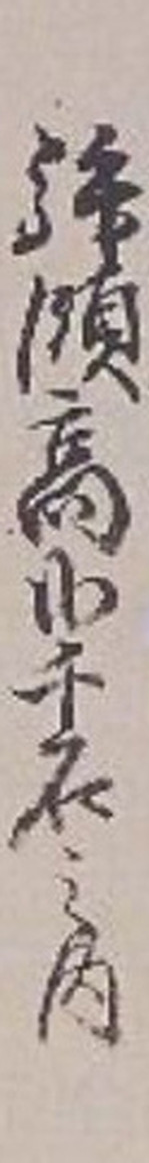拝領高弐千石之内
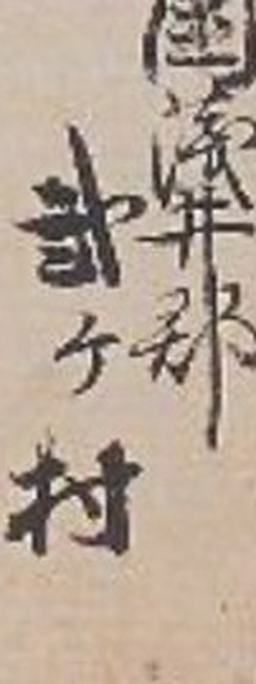弐ヶ村
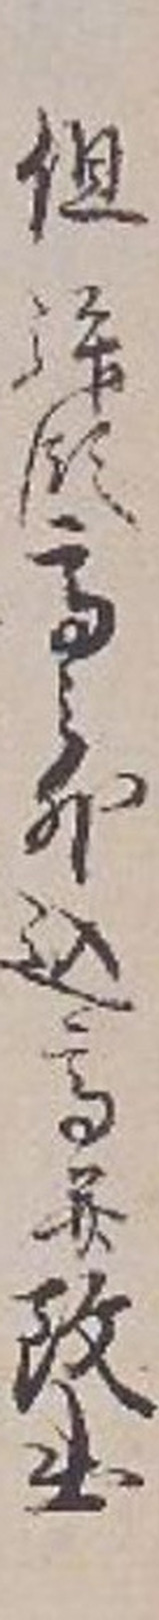但拝領高之外込高幷改出
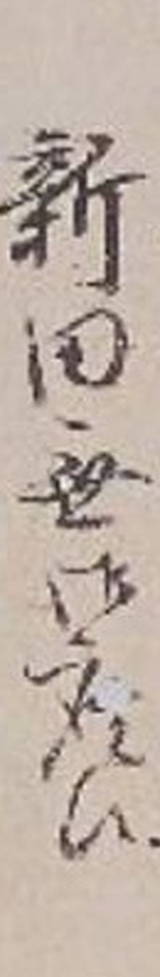新田無御座候
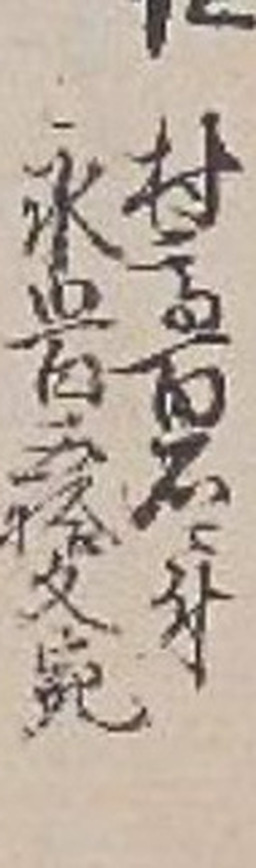永四百五拾文宛
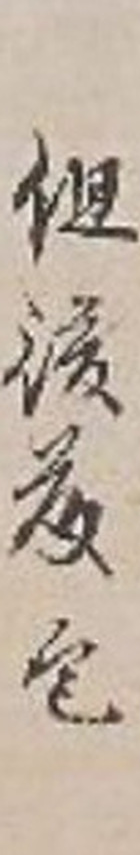但後藤定
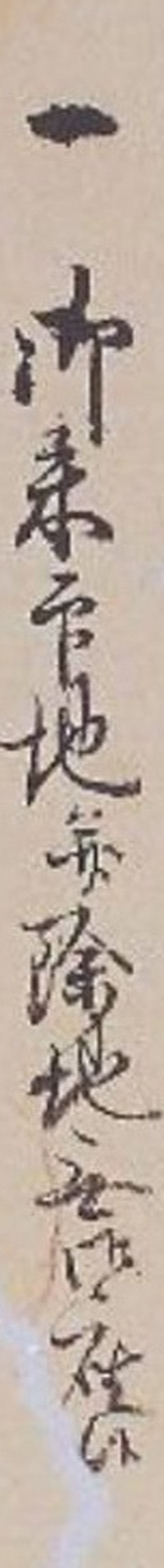一御朱印地幷除地無御座候
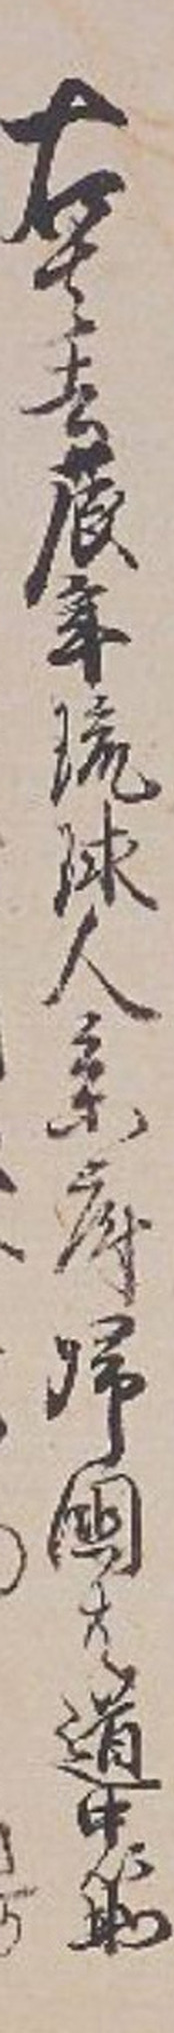右者去辰年琉球人参府帰国共道中筋
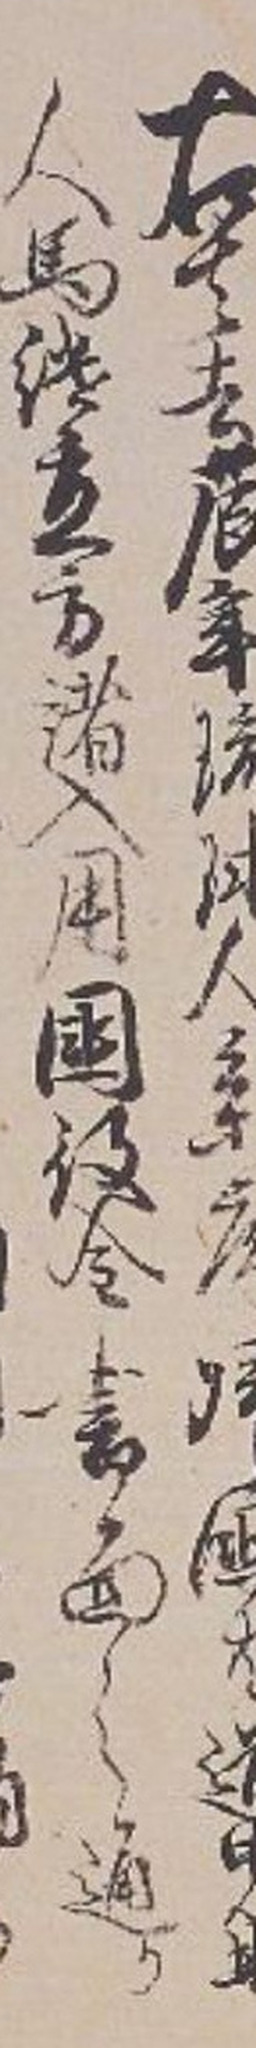人馬継立方諸入用国役金書面之通り
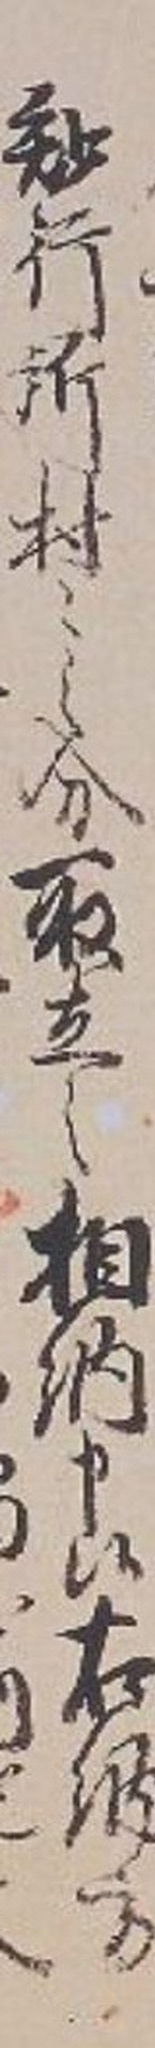知行所村々之分取立之相納申候右納方
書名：琉球人帰国に付国役金の記録
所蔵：University of the Ryukyus Library
